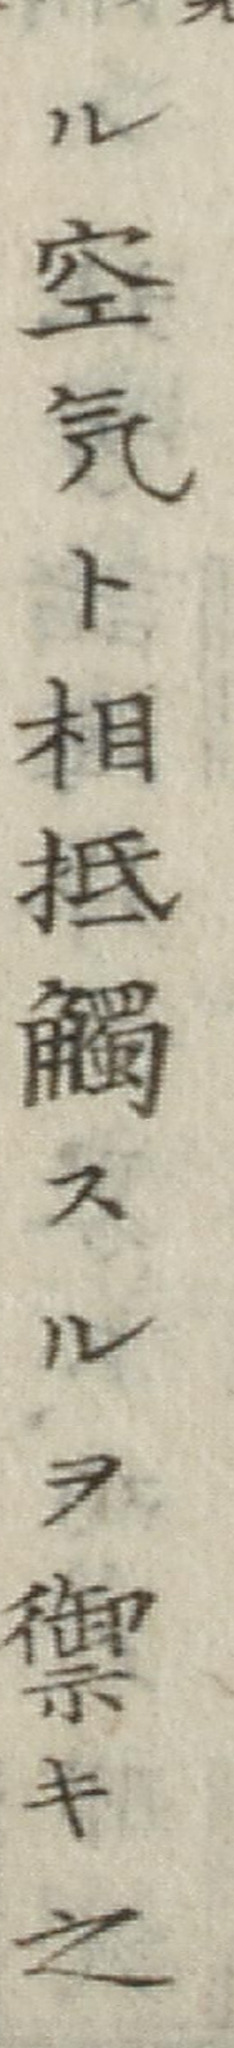ル空気ト相抵触スルヲ禦キ之
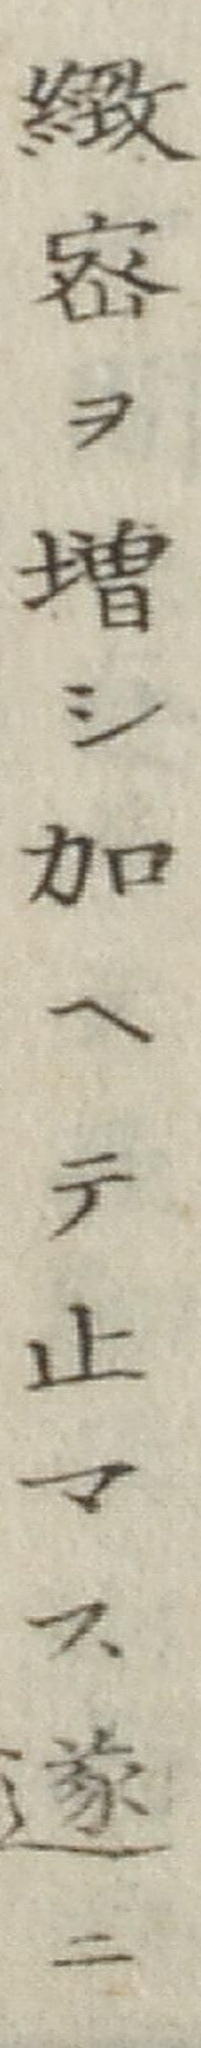緻密ヲ増シ加ヘテ止マス遂ニ
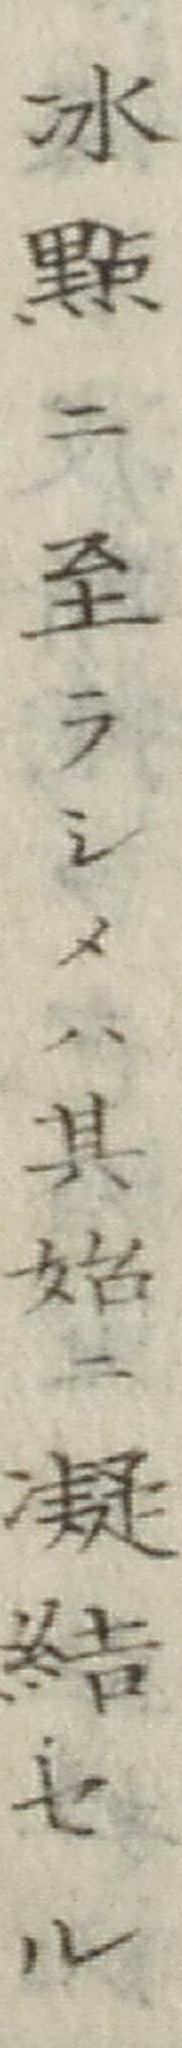氷点ニ至ラシメハ其始ニ凝結セル
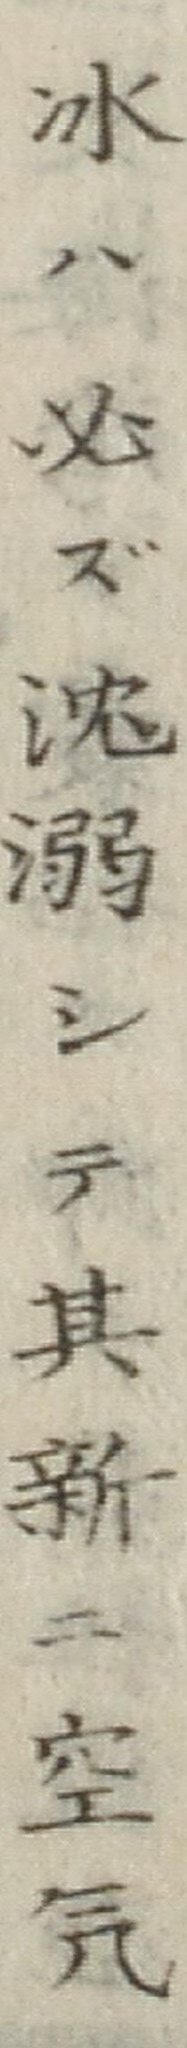氷ハ必ズ沈溺シテ其新ニ空気
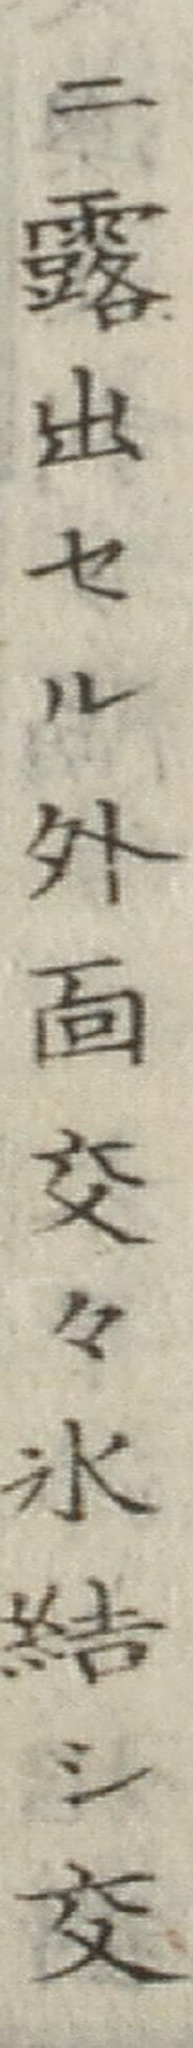ニ露出セル外面交々氷結シ交
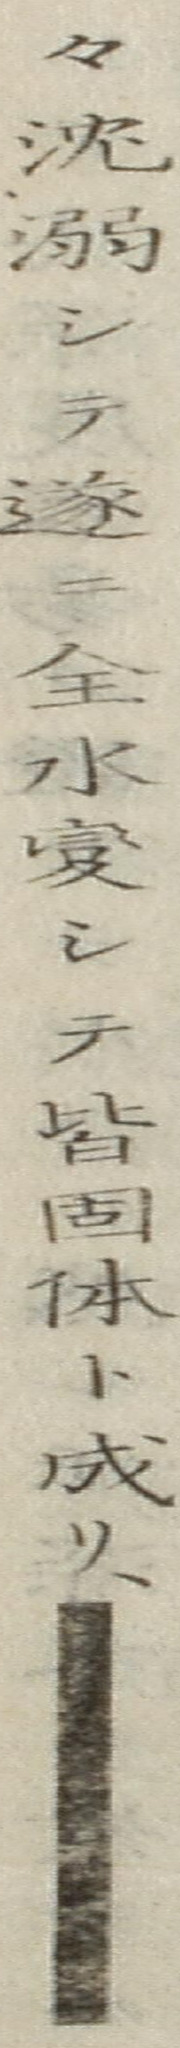々沈溺シテ遂ニ全水変シテ皆固体ト成リ、
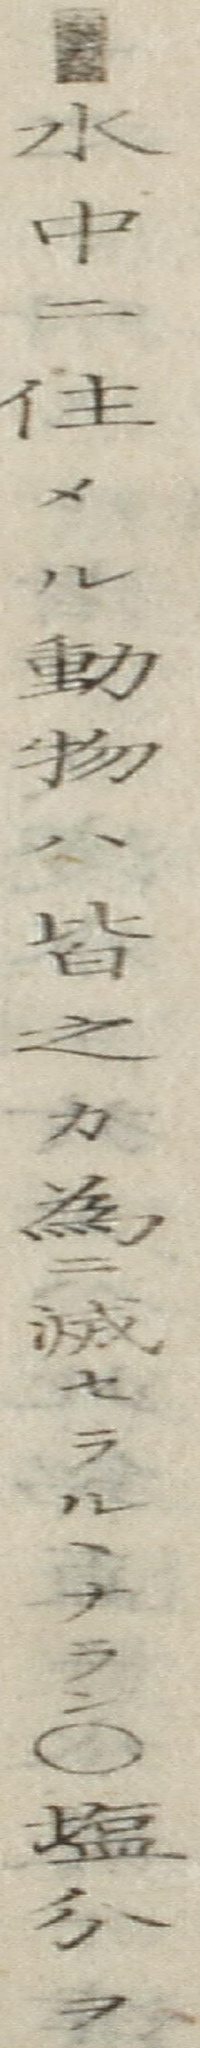水中ニ住メル動物ハ皆之カ為ニ滅セラルヽナラン○塩分ヲ
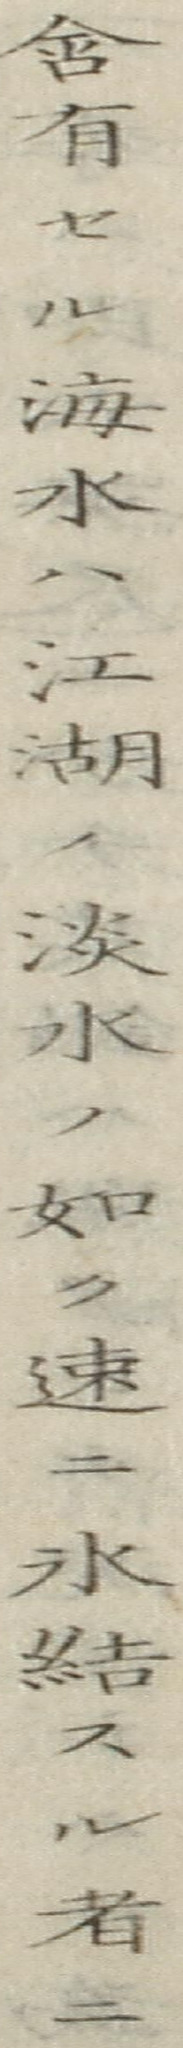含有セル海水ハ江湖ノ淡水ノ如ク速ニ氷結スル者ニ
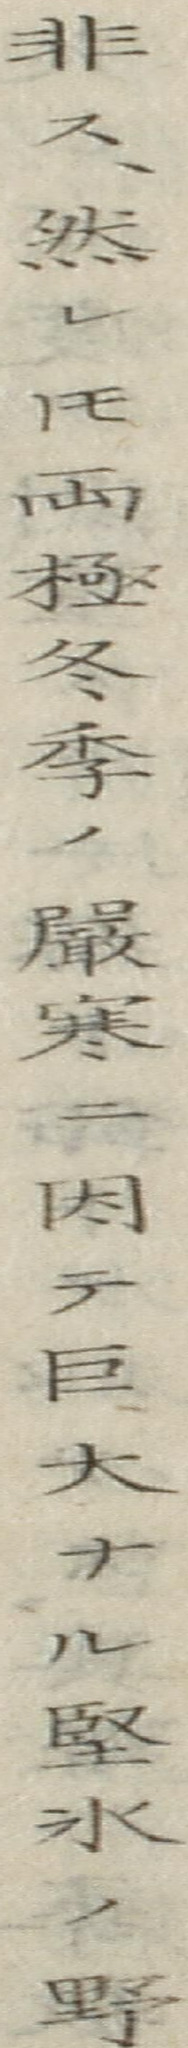非ス、然レトモ両極冬季ノ厳寒ニ因テ巨大ナル堅氷ノ野
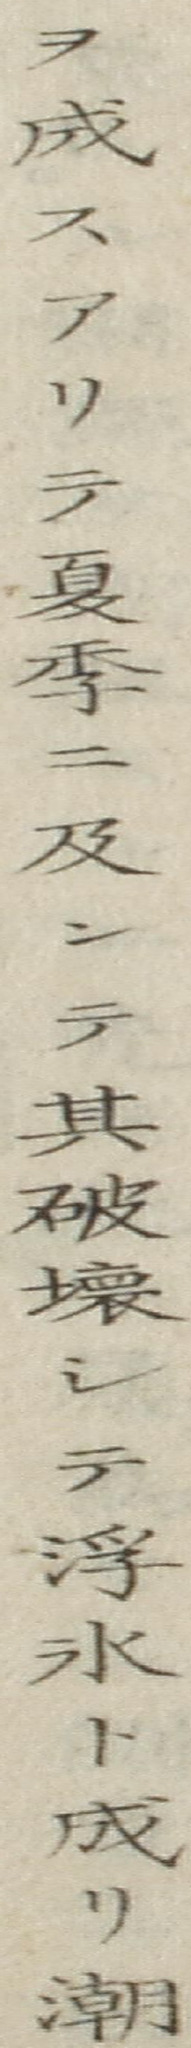ヲ成スアリテ夏季ニ及ンテ其破壊シテ浮氷ト成リ潮
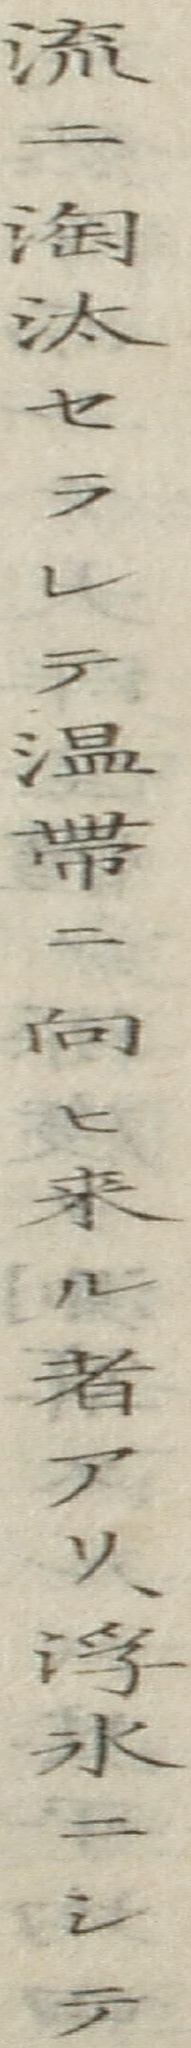流ニ淘汰セラレテ温帯ニ向ヒ来ル者アリ、浮氷ニシテ
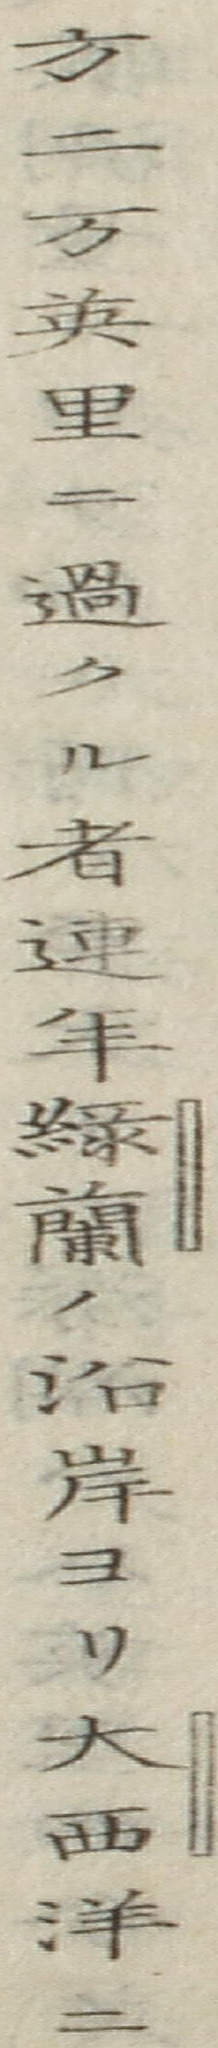方二万英里ニ過クル者連年緑蘭ノ沿岸ヨリ大西洋ニ
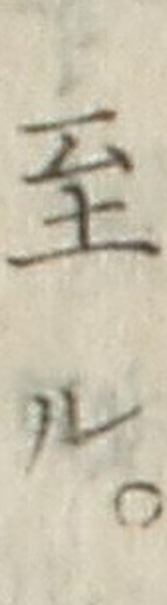至ル。
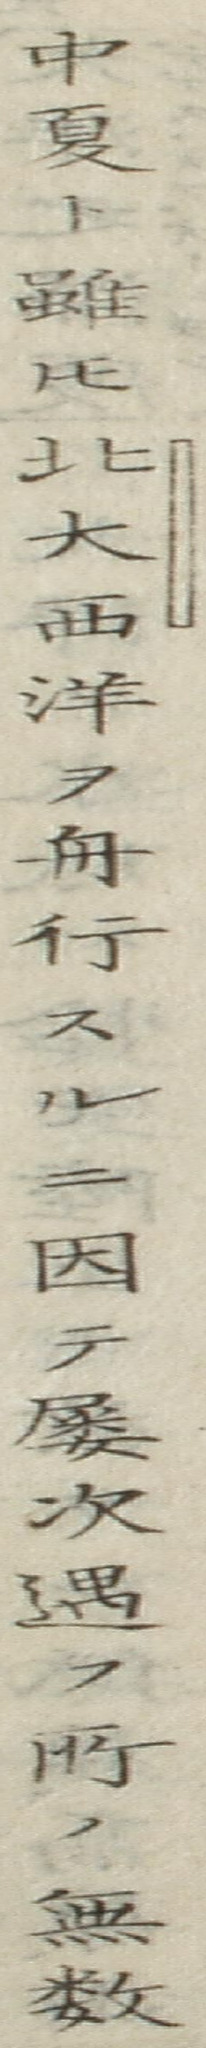中夏ト雖トモ北大西洋ヲ舟行スルニ因テ屡次遇フ所ノ無数
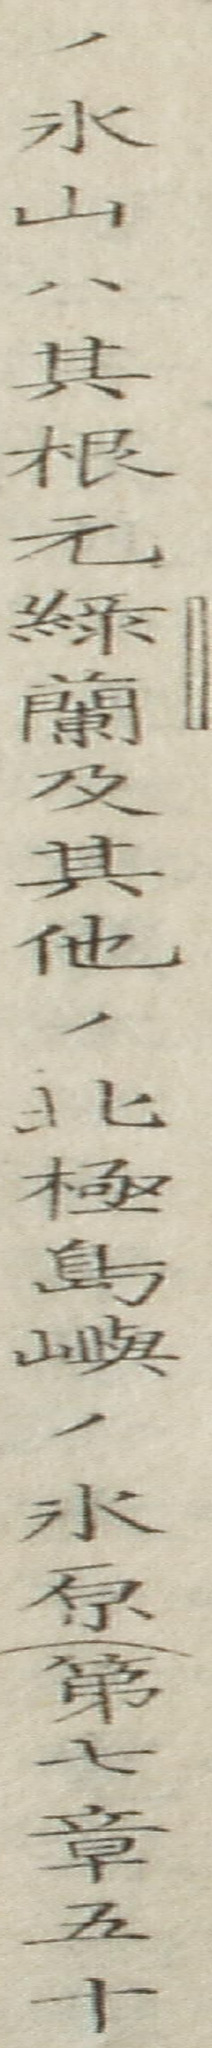ノ氷山ハ其根元緑蘭及其他ノ北極島嶼ノ氷原（第七章五十
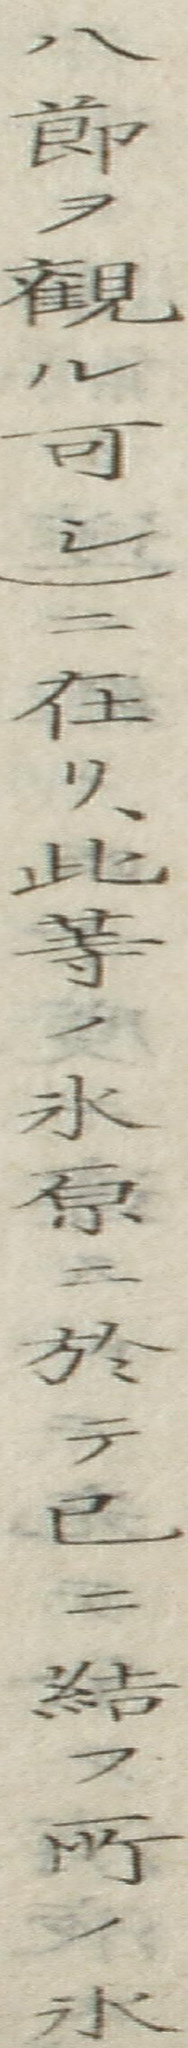八節ヲ観ル可シ）ニ在リ、此等ノ氷原ニ於テ已ニ結フ所ノ氷
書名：地形論　巻二
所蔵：東京大学地震研究所図書室 Earthquake Research Institute Library, The University of Tokyo, JAPAN
